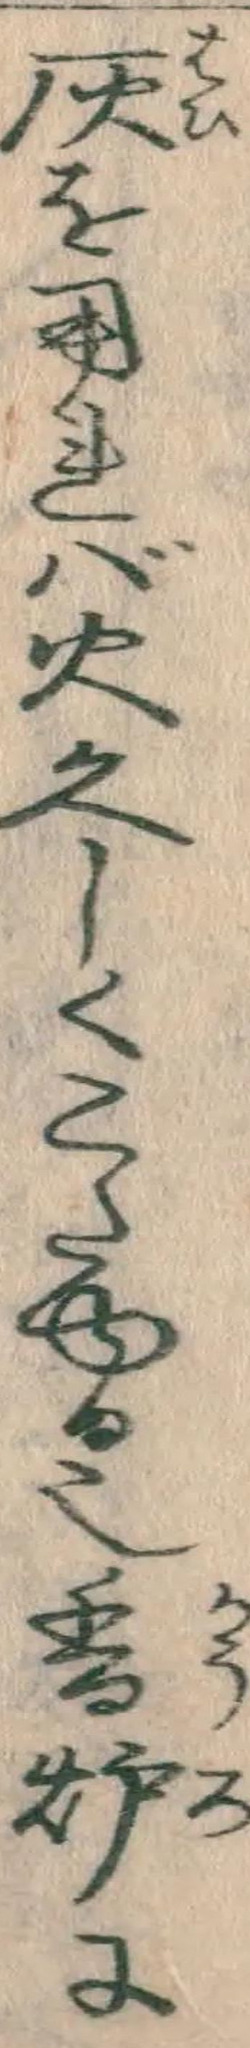灰を用れば火久しくこたゆる也香炉に
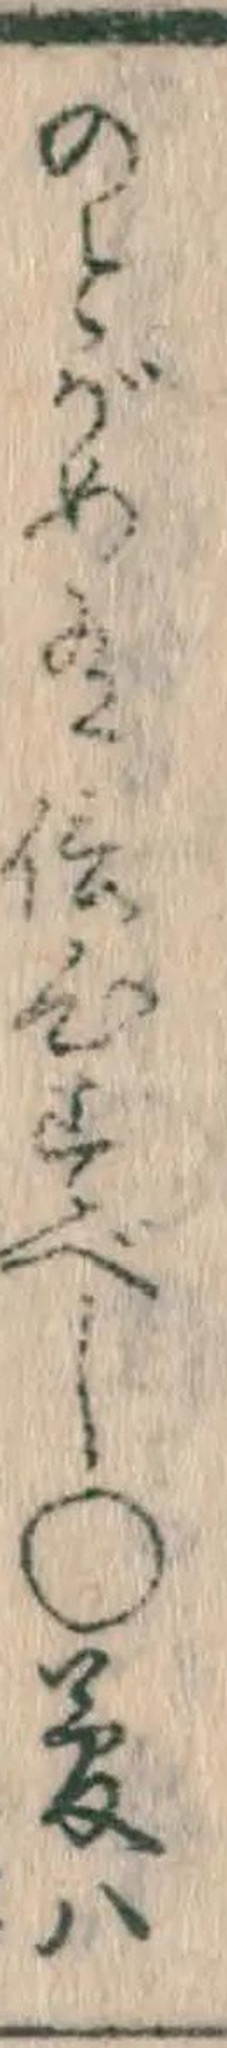のとがめ有信心すべし○夢は
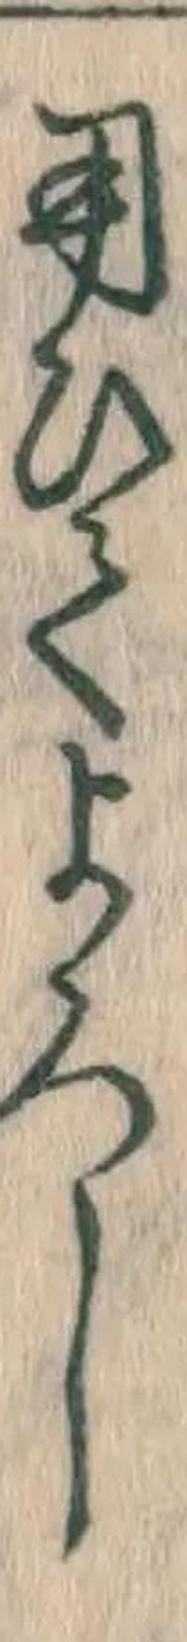用ひてよろし
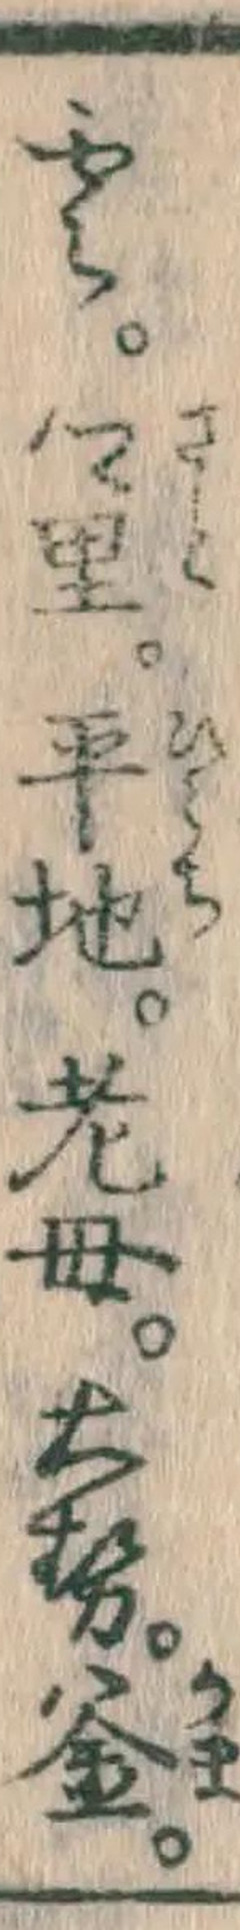雲。郷里。平地。老母。大勢。釜。
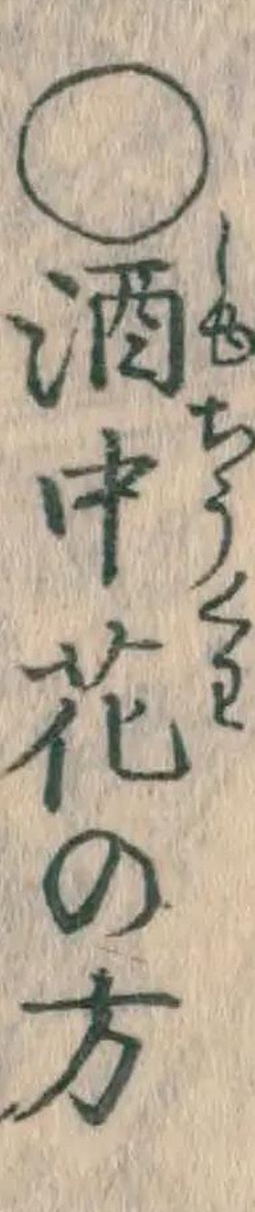○酒中花の方
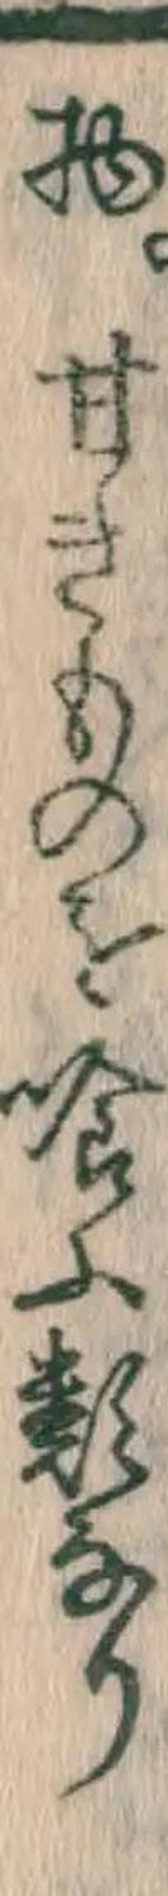物。甘きものを喰ふ類なり
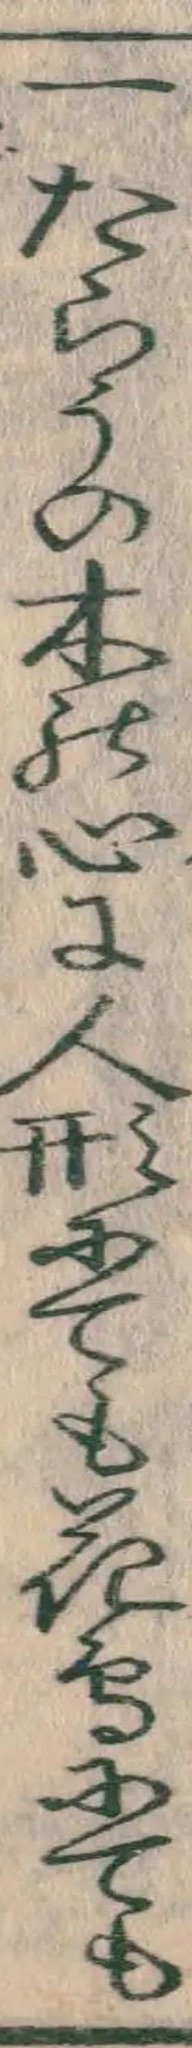一たらうの木の心に人形にても花鳥にても
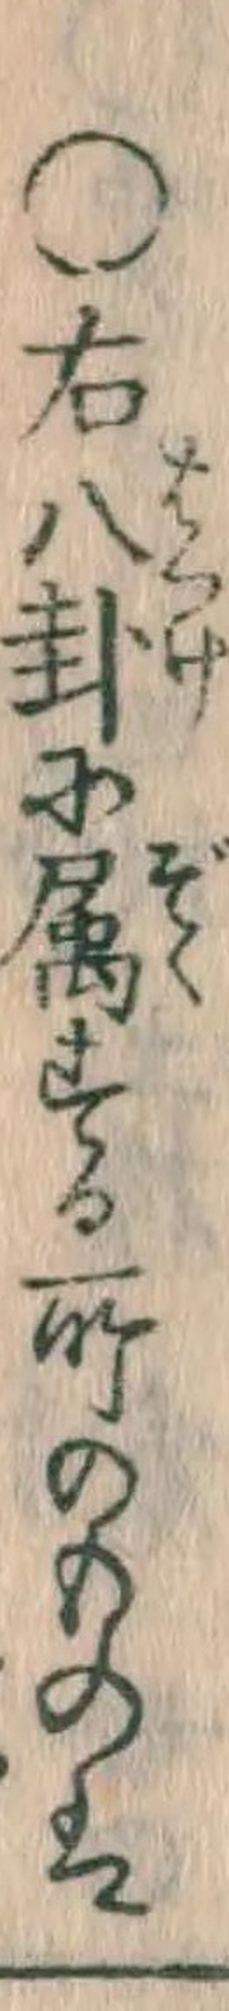○右八卦に属する所のものは
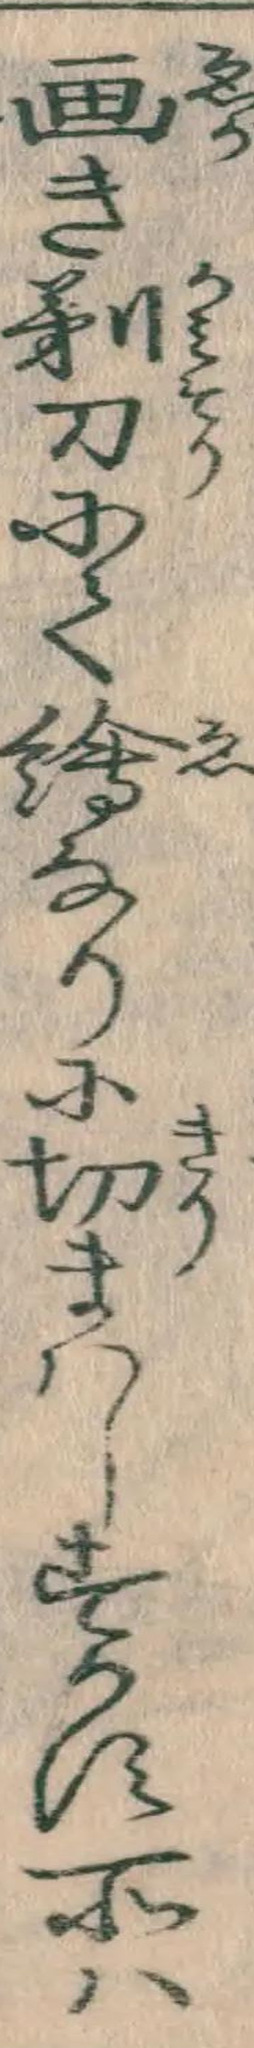画き剃刀にて絵なりに切まはしすかす所は
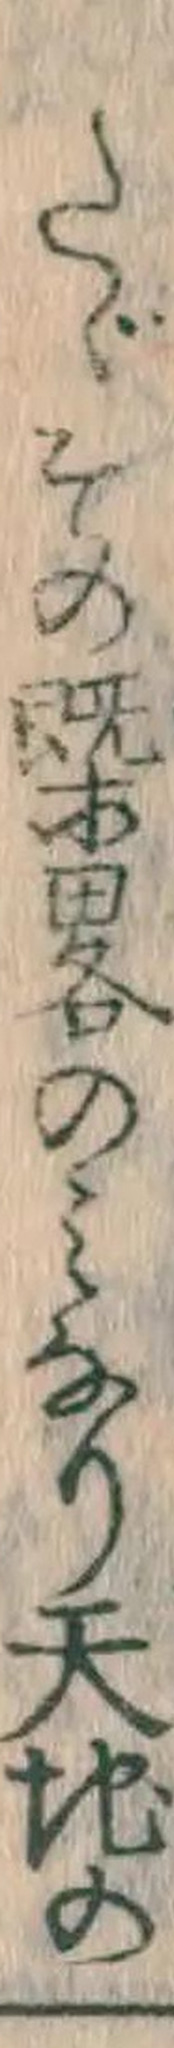たゞその概略のみなり天地の
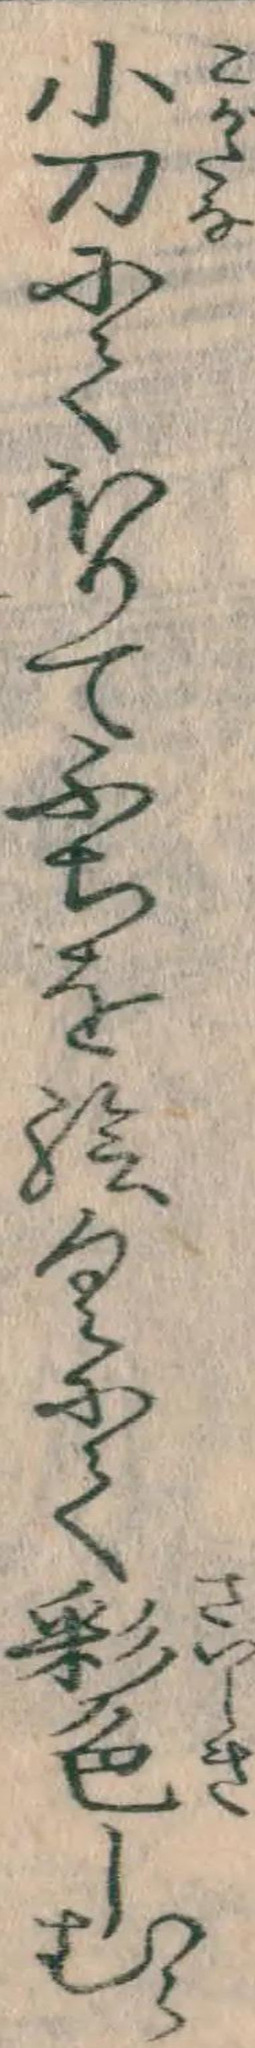小刀にてほりてふちを絵具にて彩色しむら
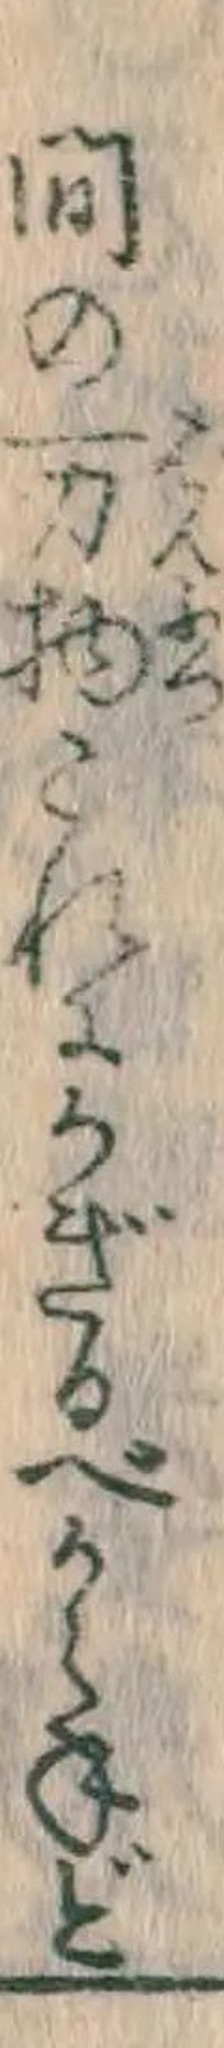間の万物これにかぎるべからねど
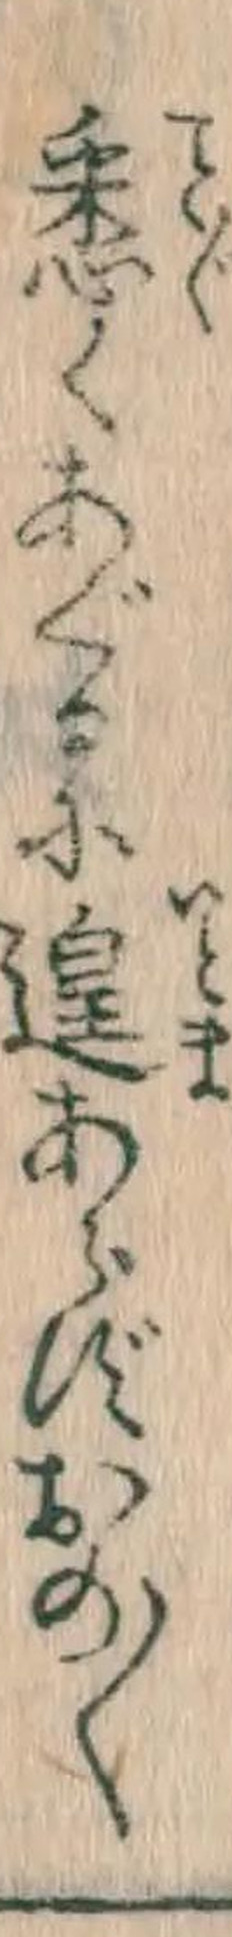悉くあぐるに遑あらずおの〳〵
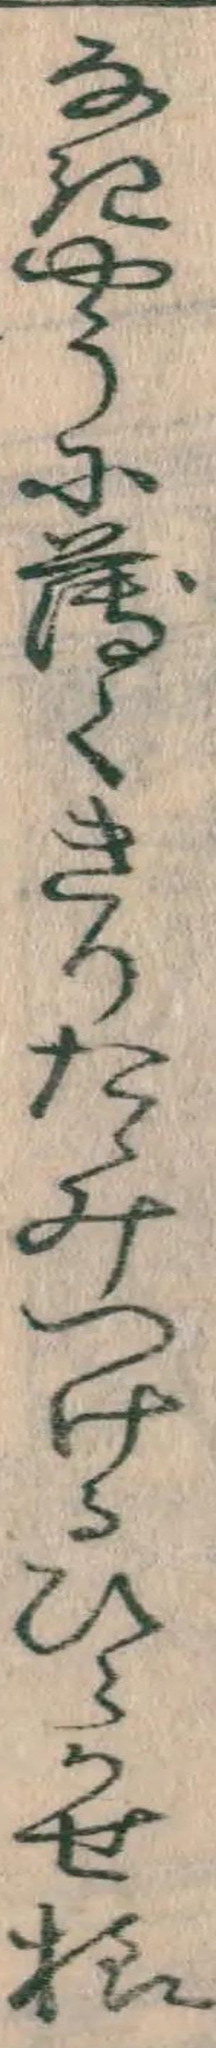なきやうに薄くきりたゝみつけるひらかせ様
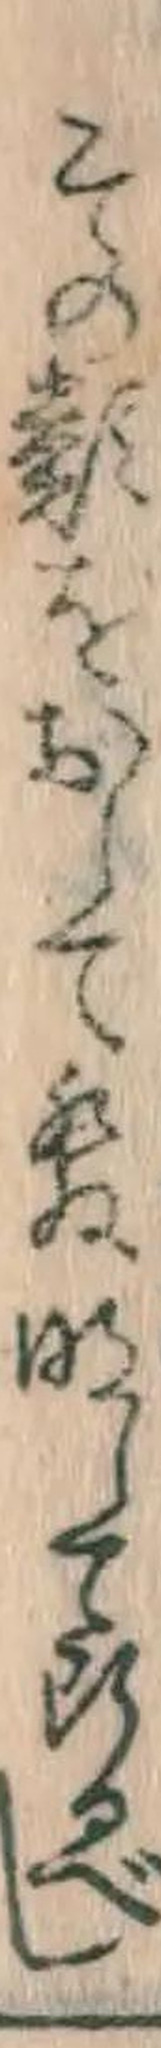その類をおして発明して断るべし
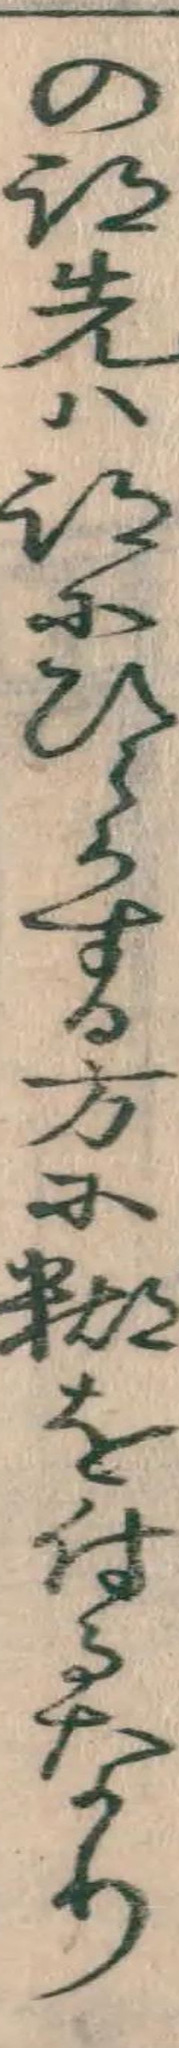の跡先は跡にひらかする方に糊を付るなり
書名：広益秘事大全 3巻. [1]
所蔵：国立国会図書館 National Diet Library, JAPAN
